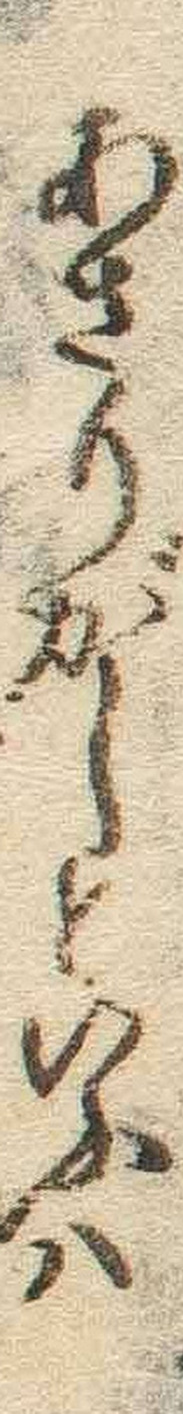あさりがしといふは
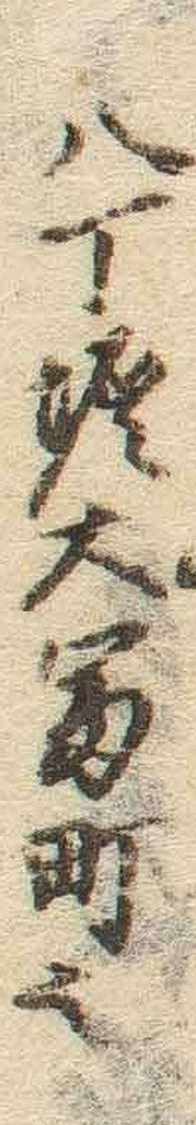八丁堀大冨町也
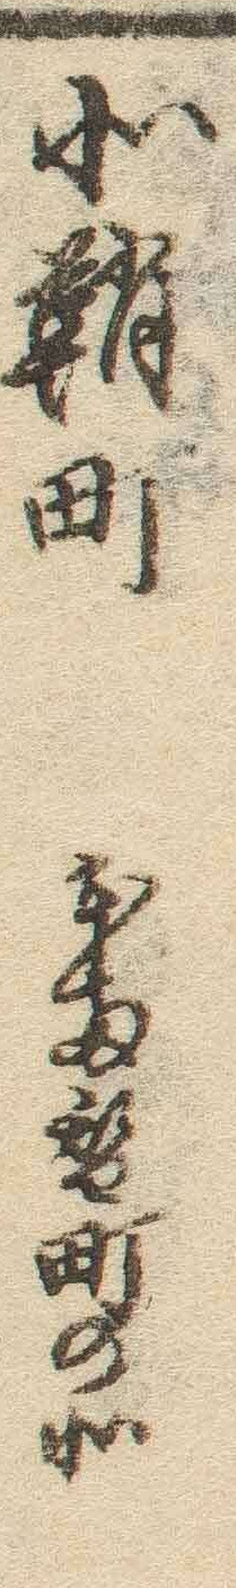北鞘町本両替町の北
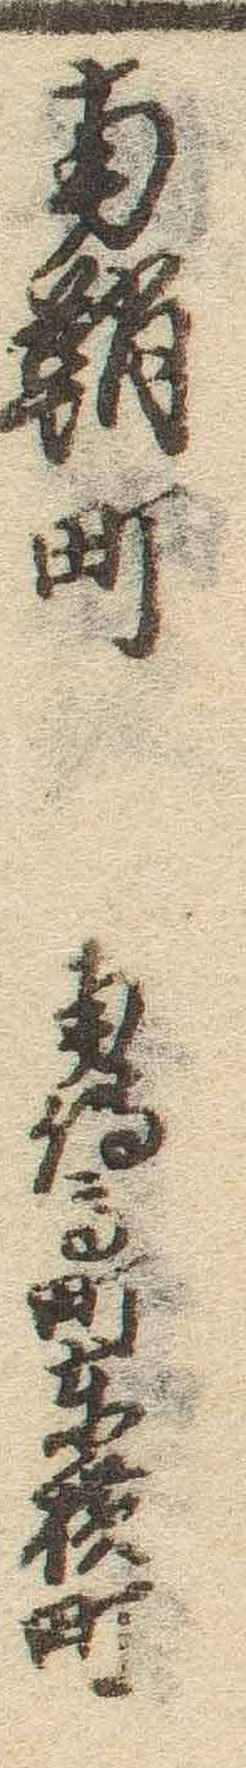南鞘町南伝馬町東横町

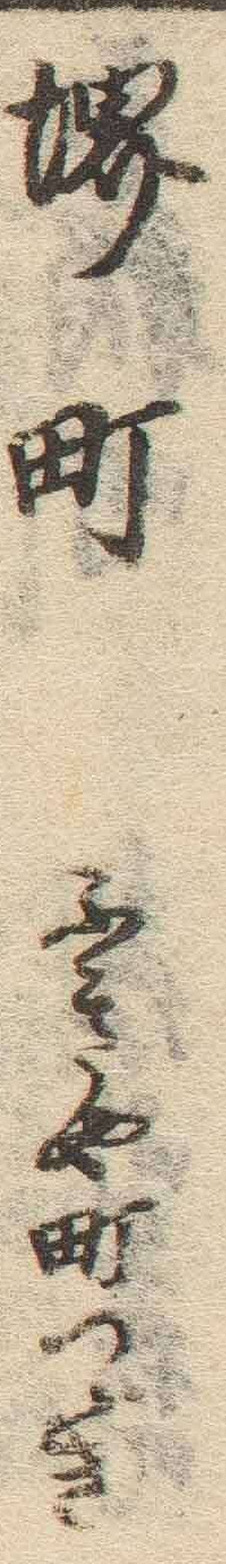堺町ふきや町つゞき
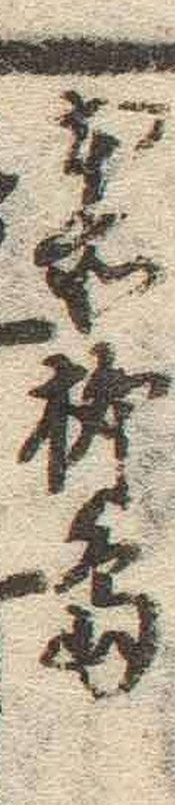本所柳島
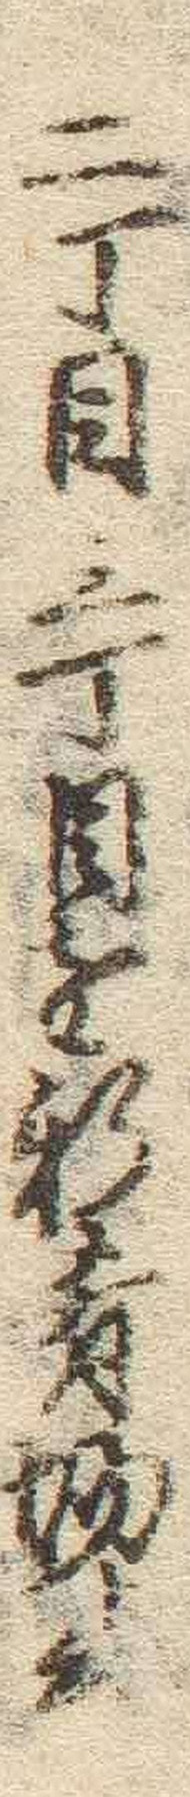二丁目三丁目を新肴場ト云
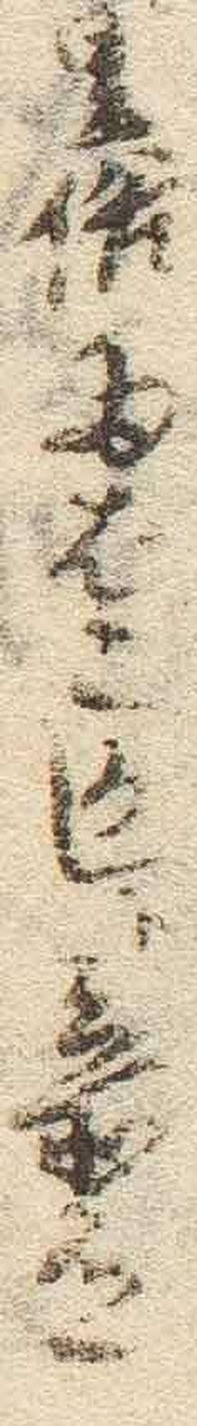里俗たばこかしト云所有
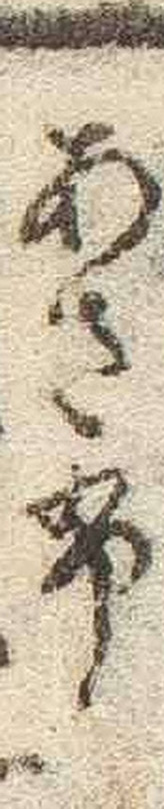あさ布
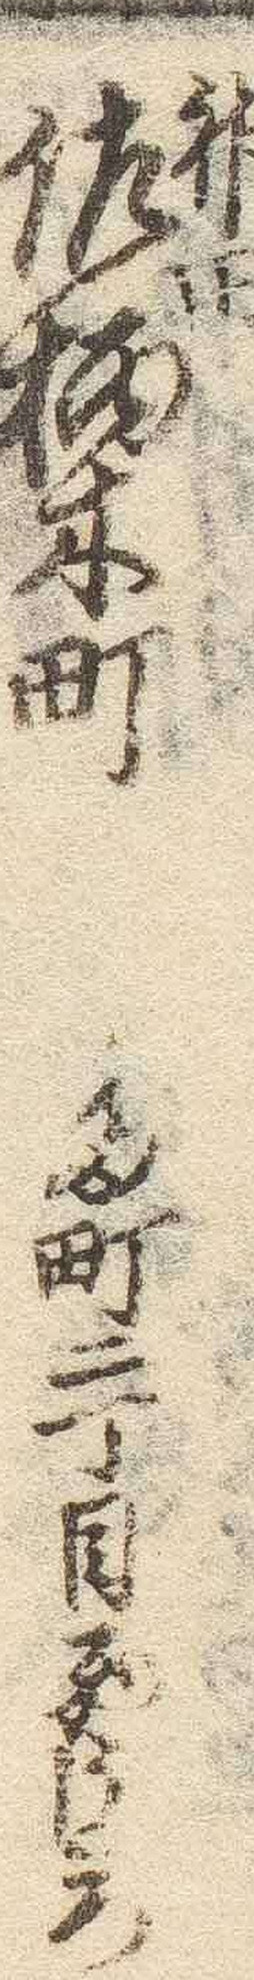佐柄木町多町二丁目西うしろ
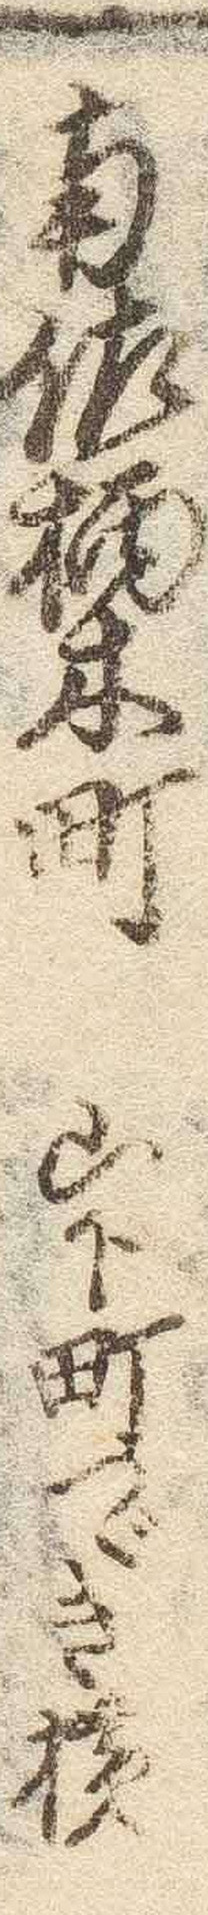南佐柄木町山下町つゞき横
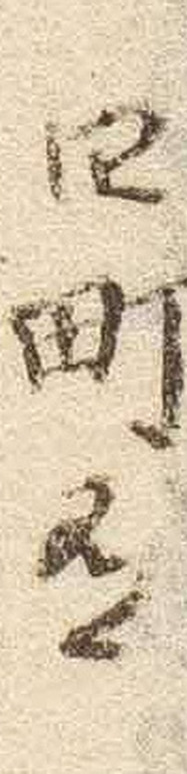四町有
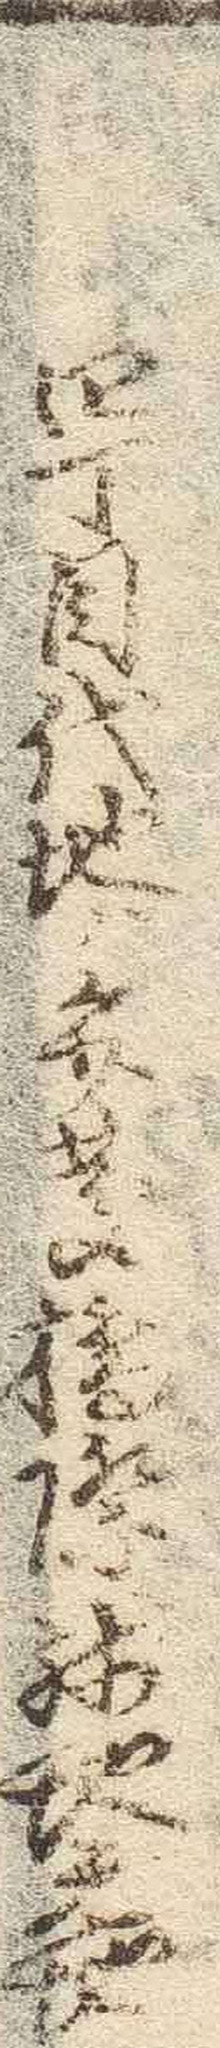四丁目代地は弁慶橋際残地元地
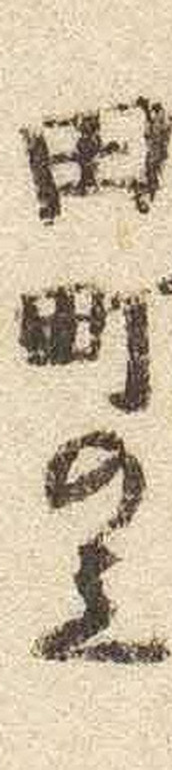田町の上
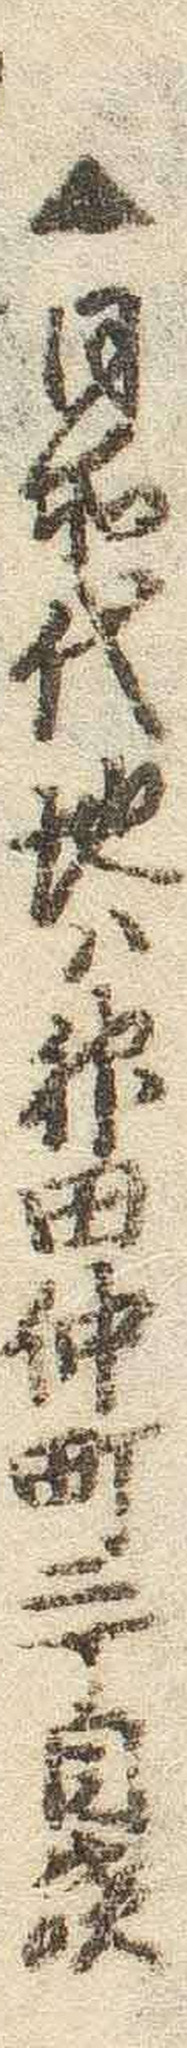▲同所代地は神田仲町二丁目続
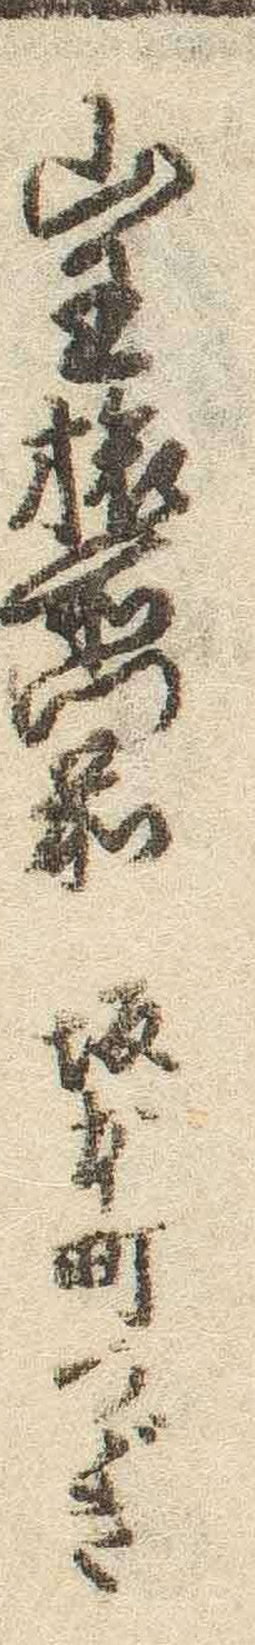山王旅所門前坂本町つゞき
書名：江戸町独案内
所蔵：東京学芸大学附属図書館 国文学研究資料館
